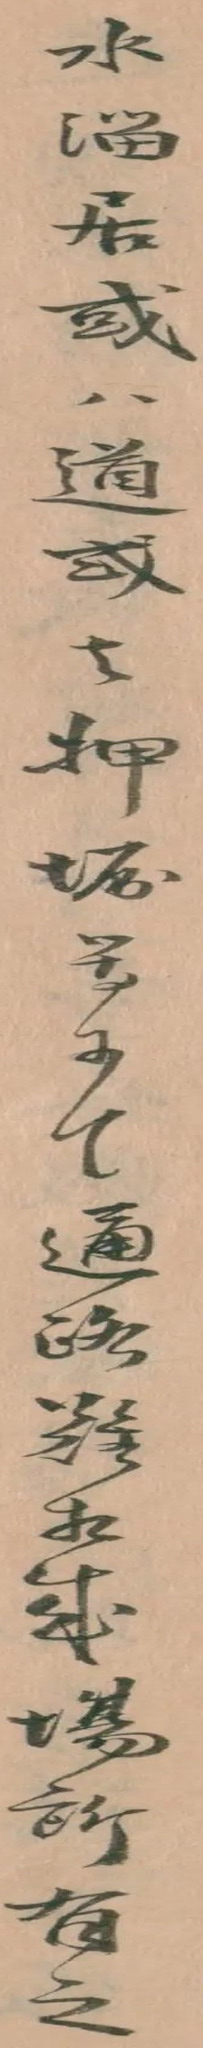水溜居或ハ道或者押掘等にて通路難相成場所有之
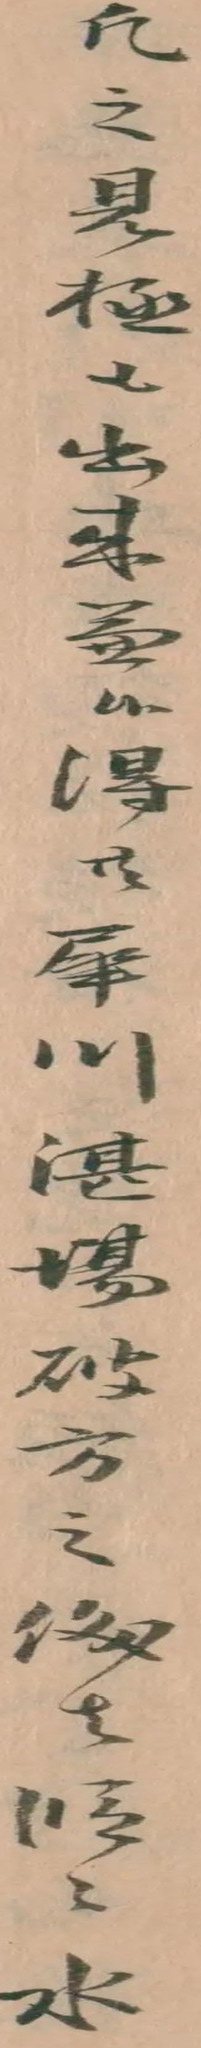凡之見積も出来兼候得共犀川湛場破方之儀者段々水
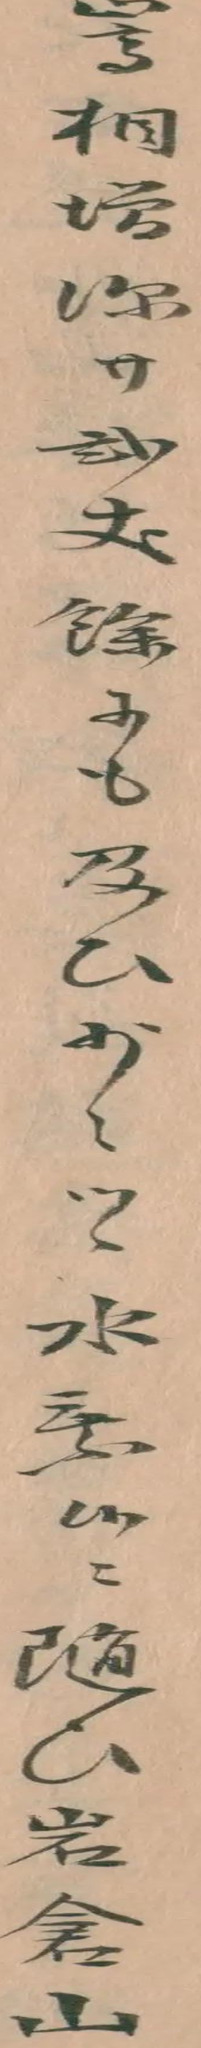嵩相増深サ弐丈余にも及ひ少々ツゝ水乗候ニ随ひ岩倉山
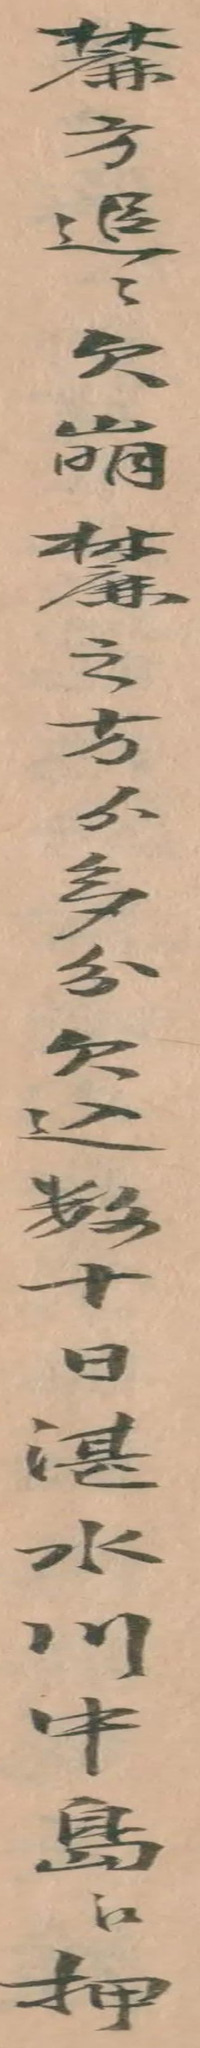麓方追々欠崩麓之方ゟ多分欠込数十日湛水川中島江押

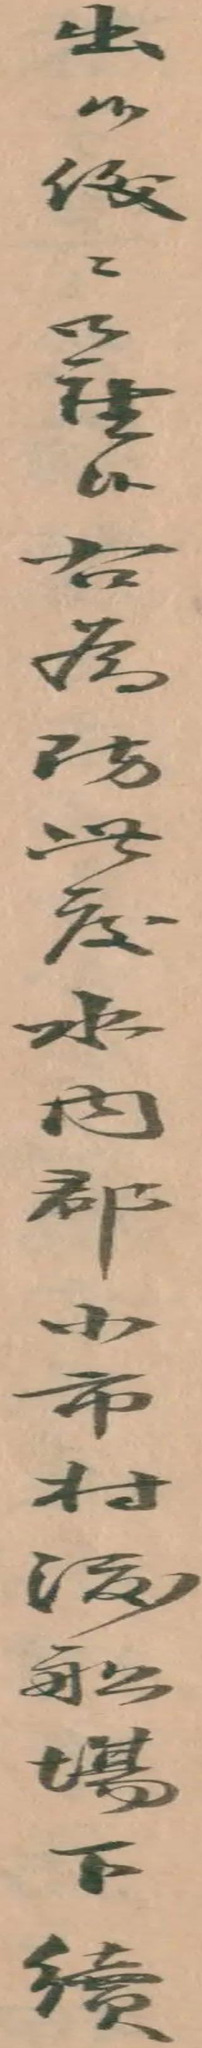出候儀ニ御座候右為防此度水内郡小市村渡船場下続
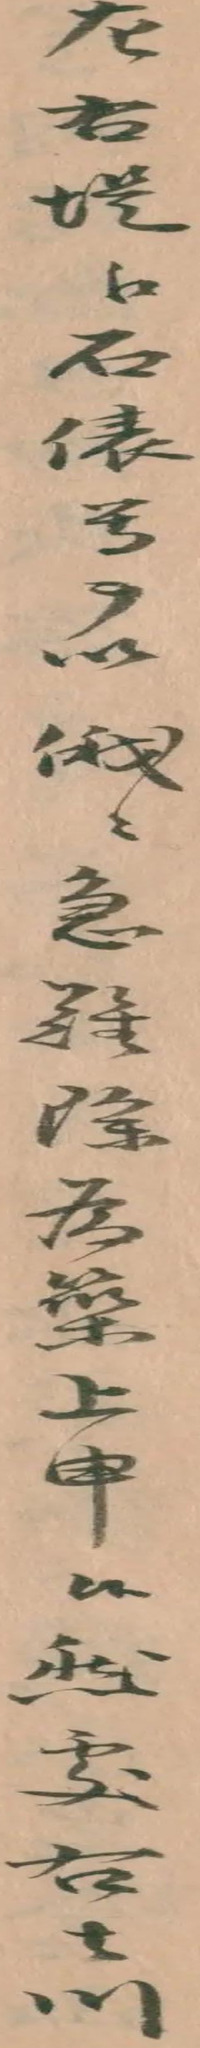左右之堤之石俵等ヲ以俄ニ急難除為築上申候然処右者川
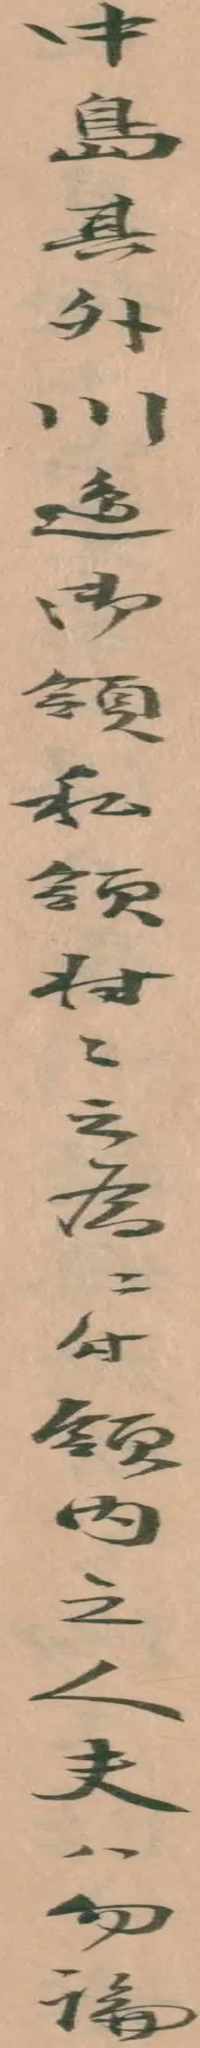中島其外川辺御料私領村々之為ニ付領内之人夫ハ勿論
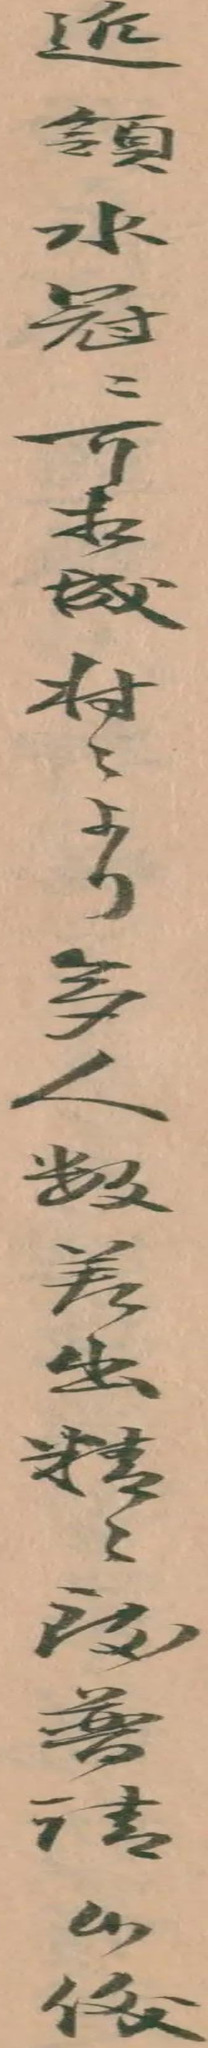近領水冠ニ可相成村々より多人数差出精々致普請候儀
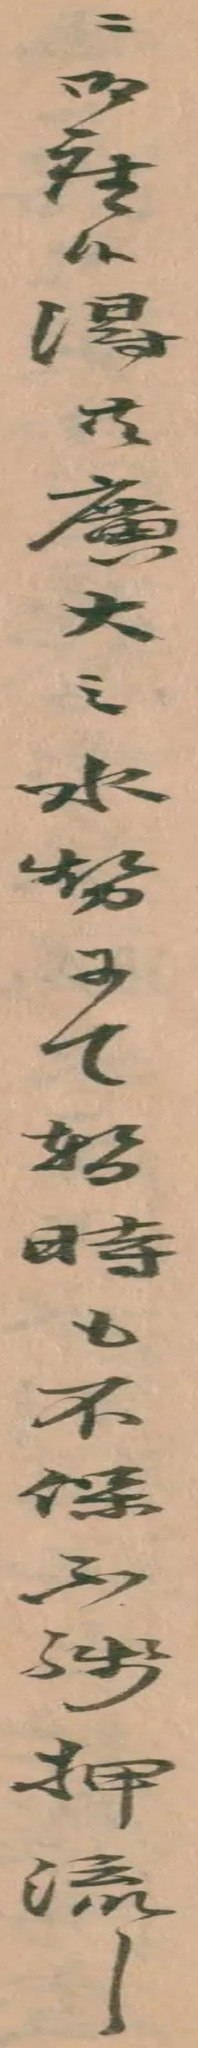ニ御座候得共広太之水勢にて暫時も不保不残押流し
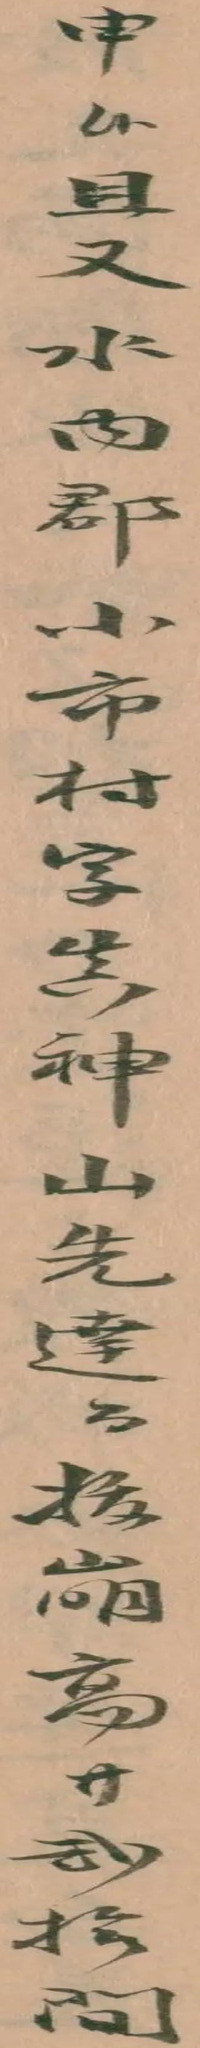申候且又水内郡小市村之字真神山先達而抜崩高サ弐拾間
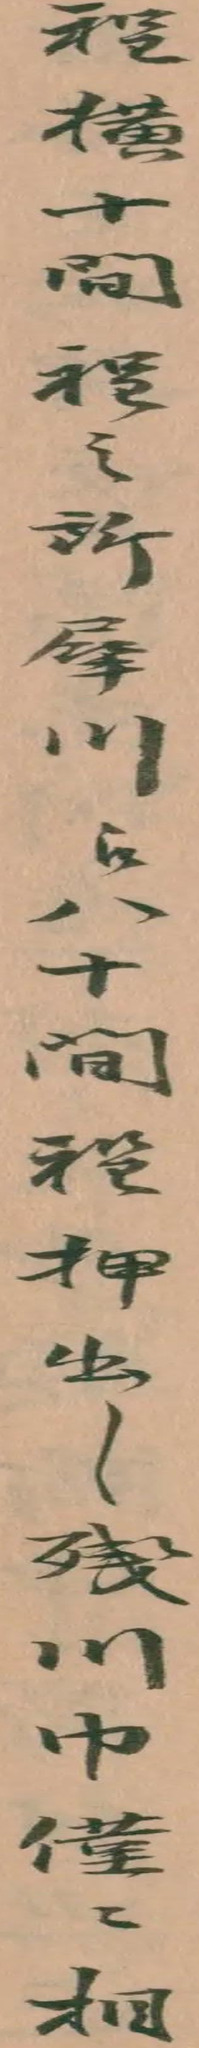程横十間程之所犀川江八十間程押出し残川幅僅ニ相
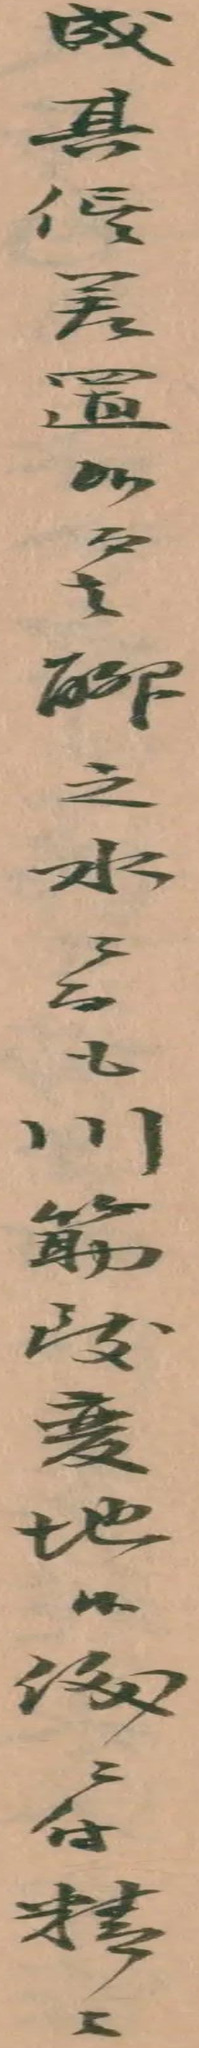成其侭差置候而者聊之水ニ而も川筋致変地候儀ニ付精々
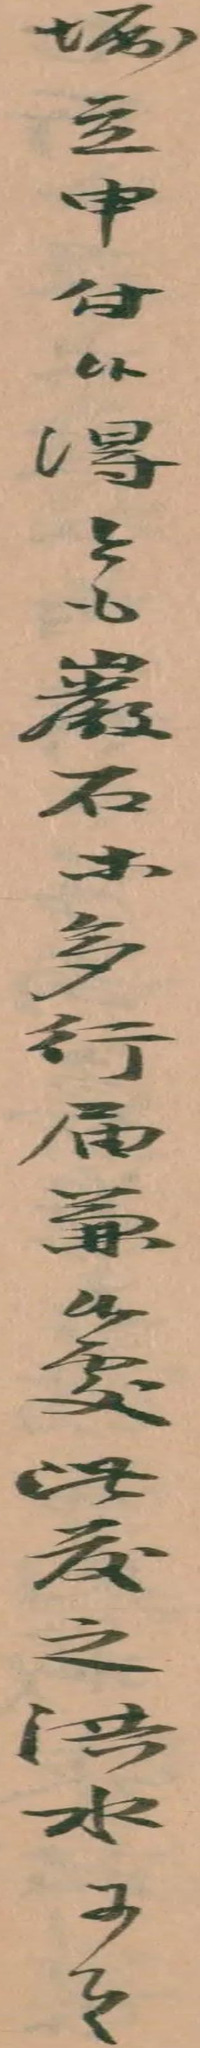掘立申付候得とも巌石等多行届兼候処此度之洪水にて
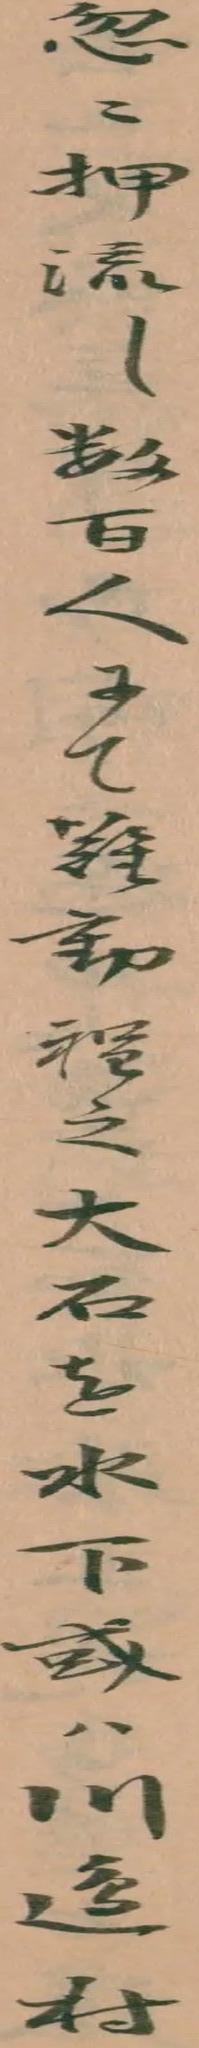忽ニ押流し数百人にて難動程之大石ヲ川下或ハ川辺村
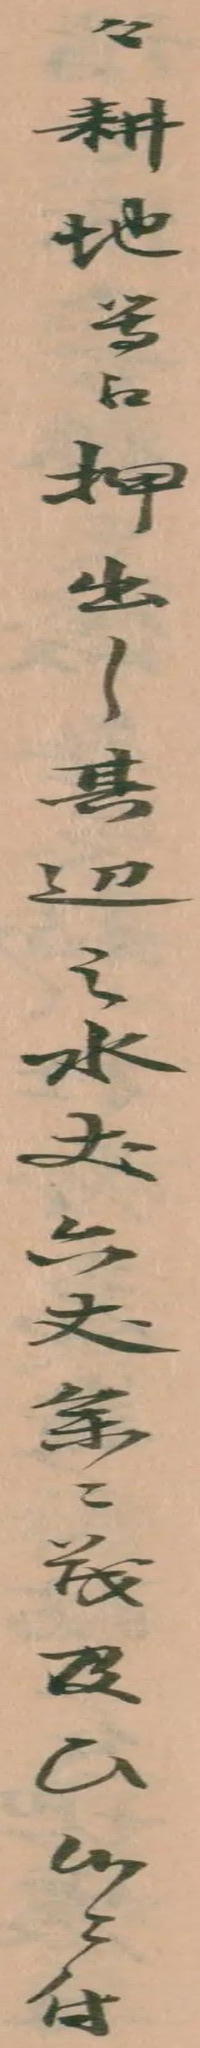々耕地等江押出し其辺之水丈六丈余ニも及ひ候ニ付
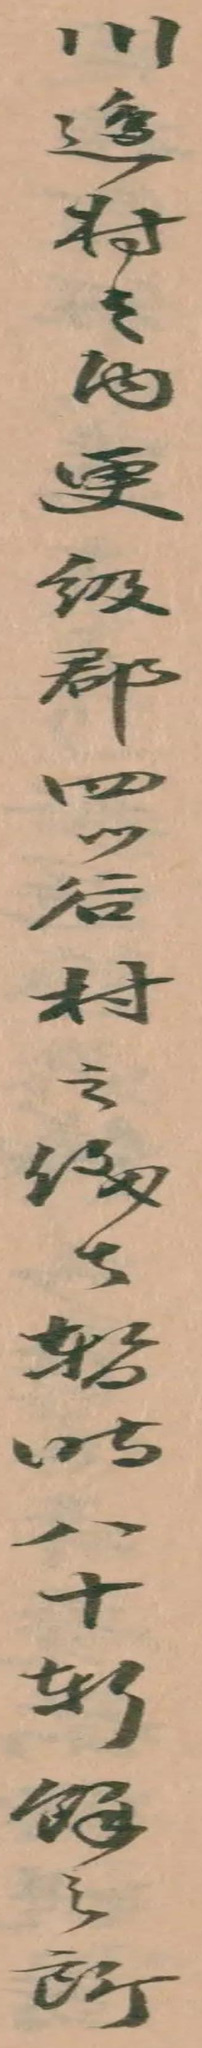川辺村々之内更級郡四ツ谷村之儀者暫時八拾軒余之所
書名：地災撮要. 巻3(地震之部)-巻4(噴火之部)
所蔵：国立国会図書館 National Diet Library, JAPAN
